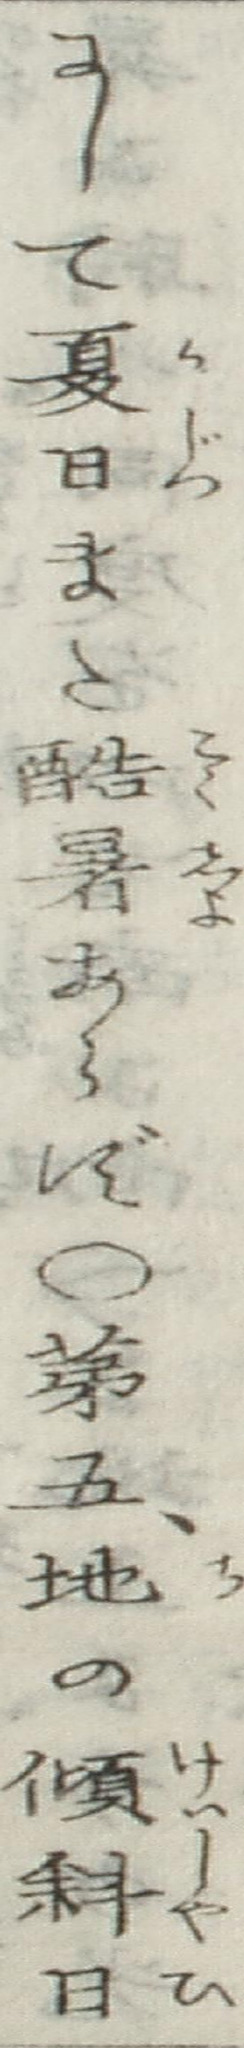にして夏日また酷暑あらず○第五、地の傾斜日
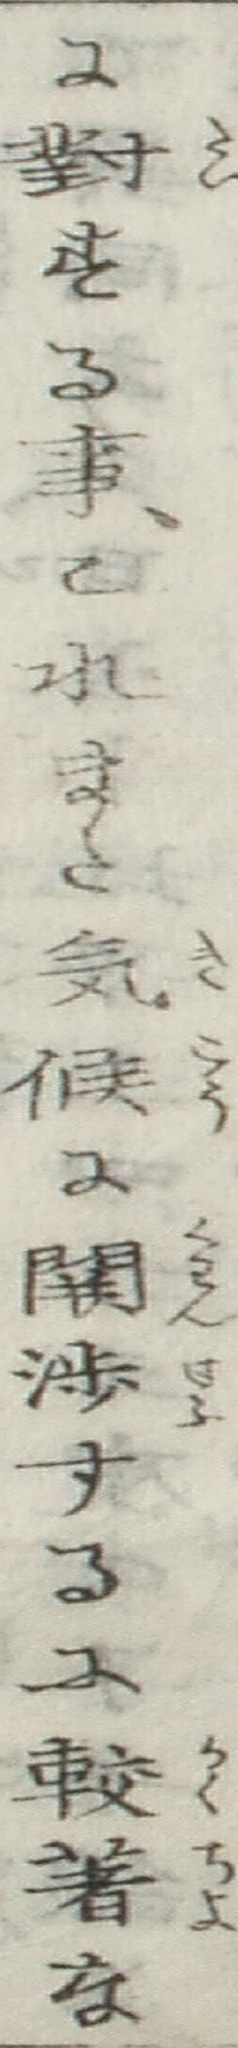に対する事、これまた気候に関渉するに較著な
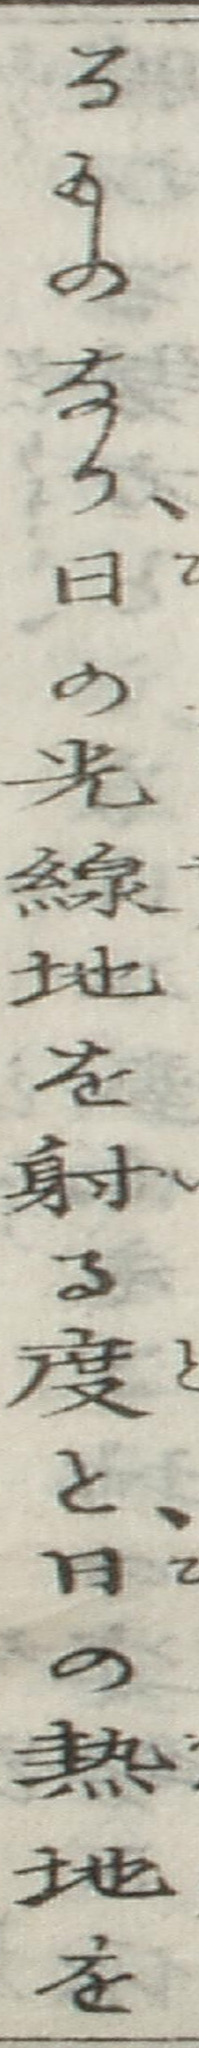るものなり、日の光線地を射る度と、日の熱地を

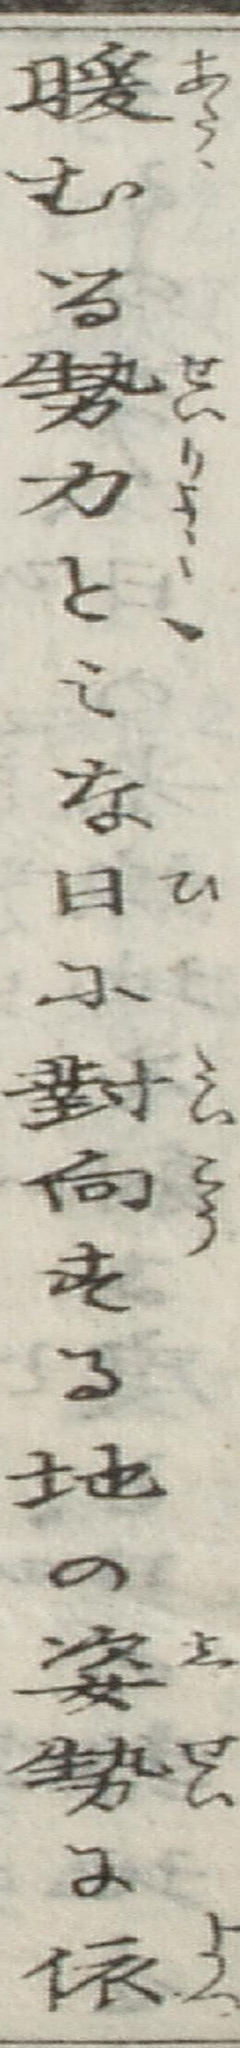暖むる勢力と、みな日に対向する地の姿勢に依
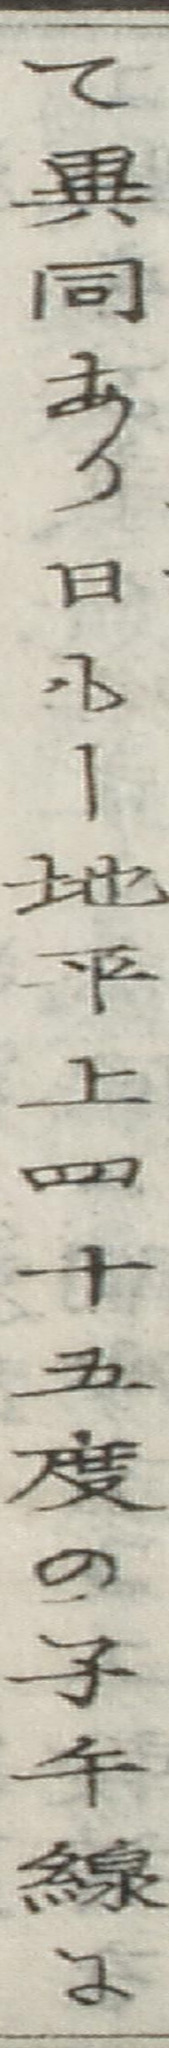て異同あり、日もし地平上四十五度の子午線に
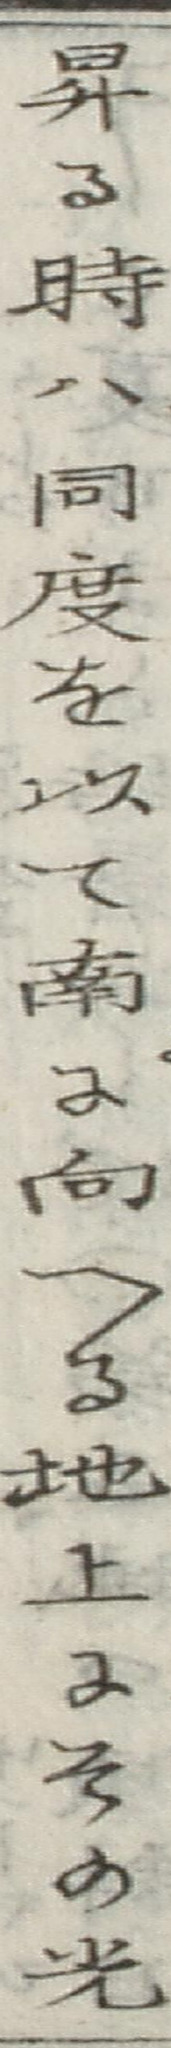昇る時は、同度を以て南に向へる地上に、その光
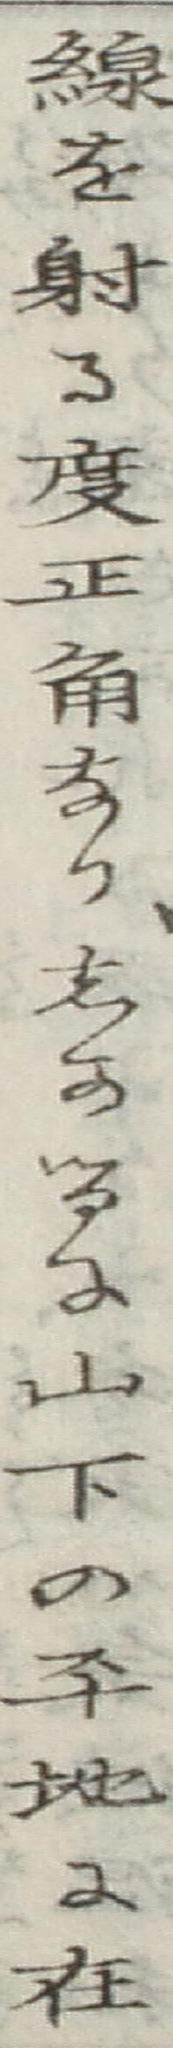線を射る度正角なり、しかるに山下の平地に在
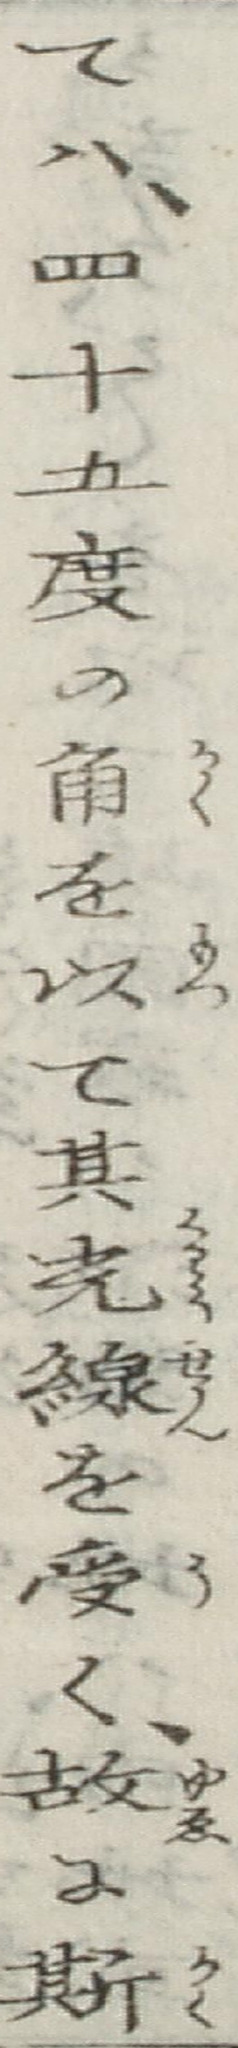ては、四十五度の角を以て其光線を受く、故に斯
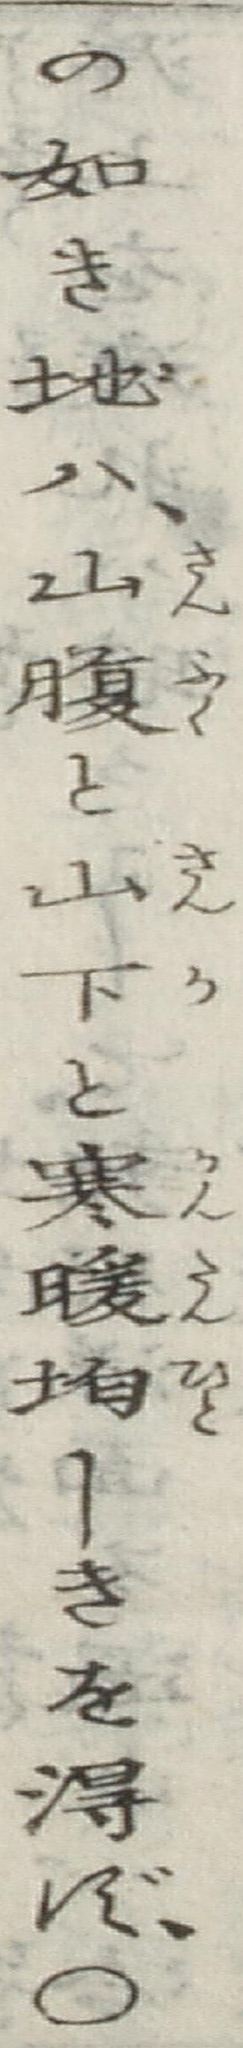の如き地は、山腹と山下と寒暖均しきを得ず、○
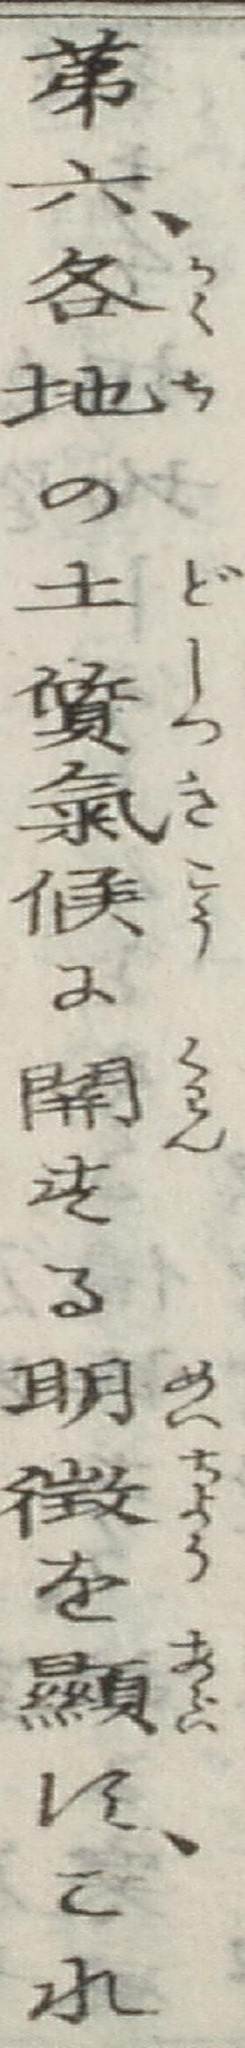第六、各地の土質気候に関する明徴を顕す、これ
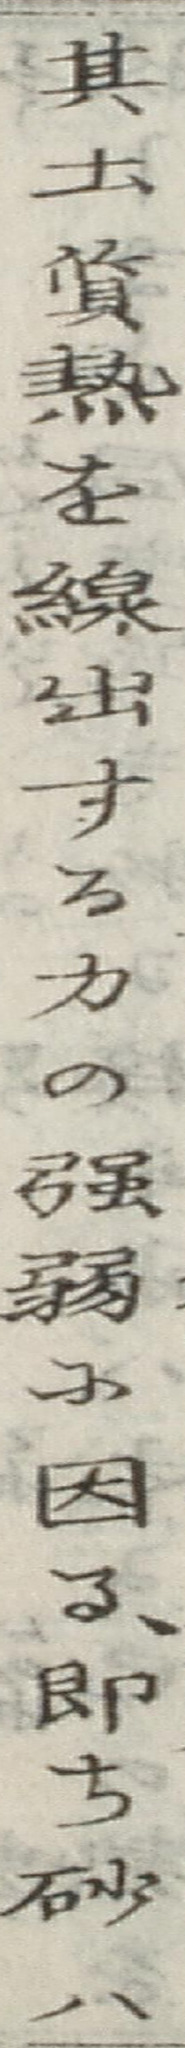其土質熱を線出する力の強弱に因る、即ち砂は
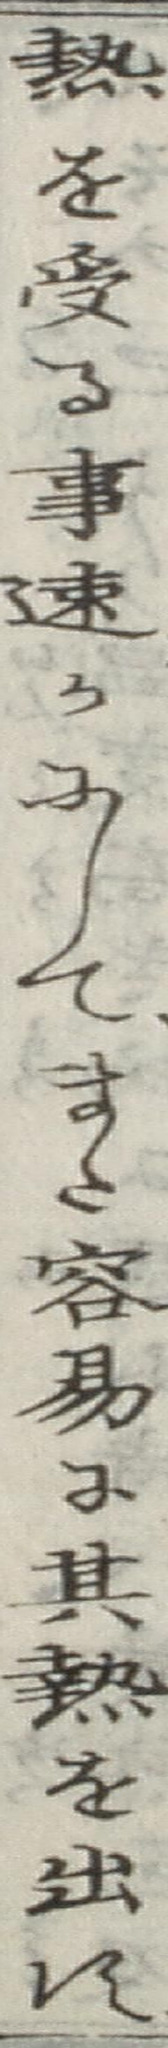熱を受る事速かにして、また容易に其熱を出す、
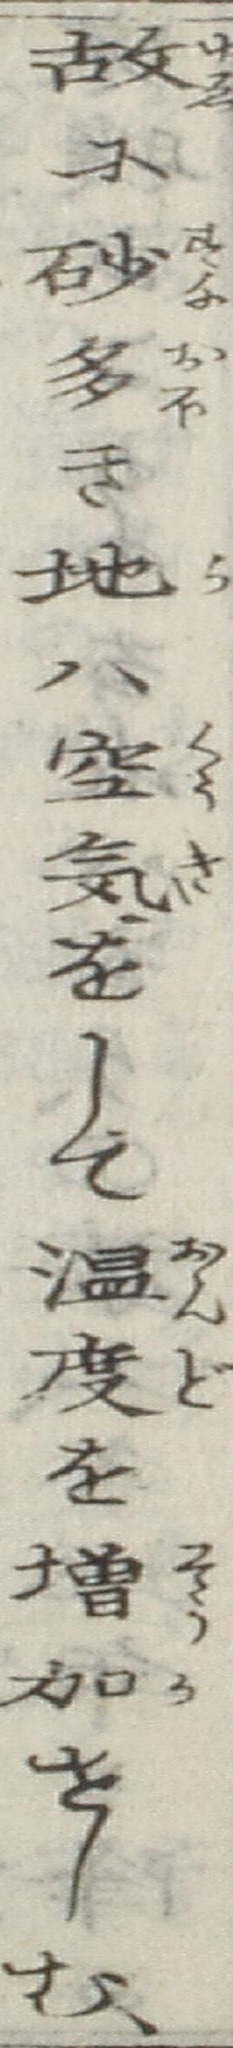故に砂多き地は空気をして温度を増加をしむ、
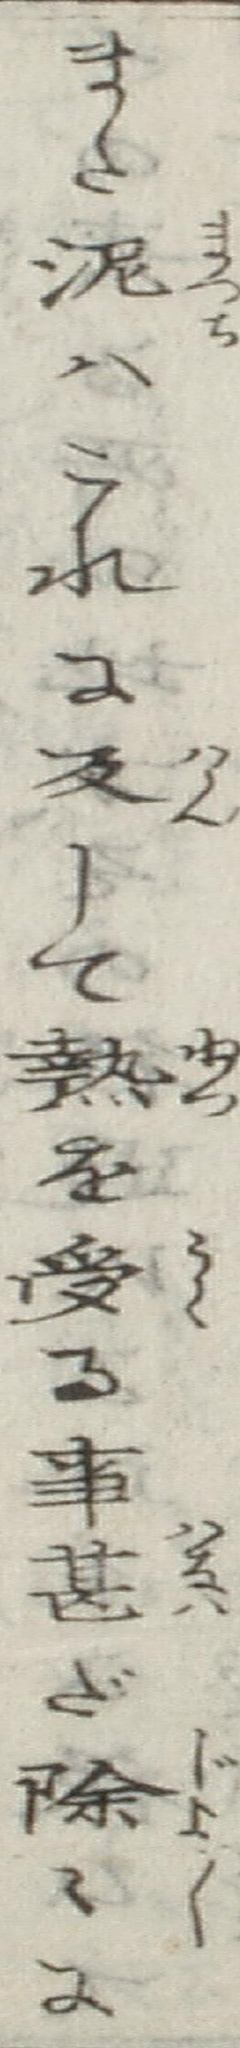また泥はこれに反して熱を受る事甚だ除々に
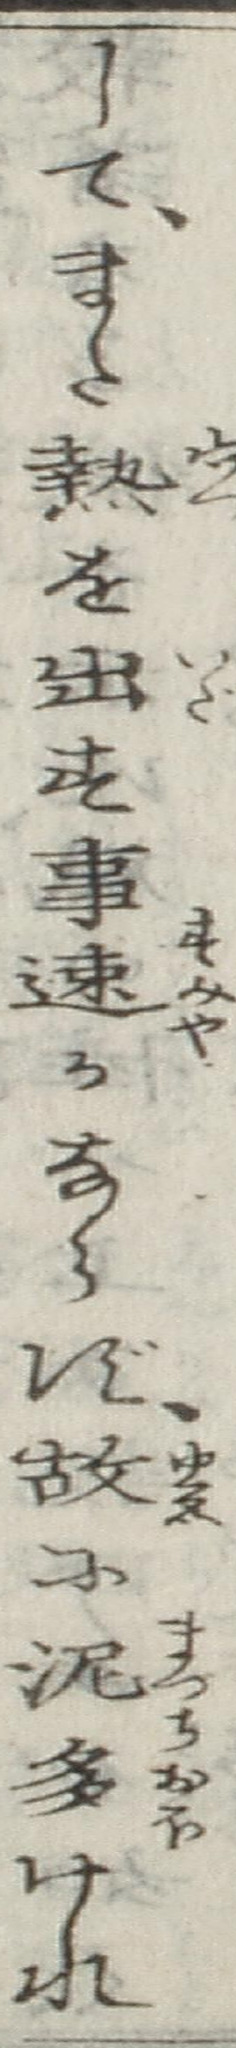して、また熱を出す事速かならず、故に泥多けれ
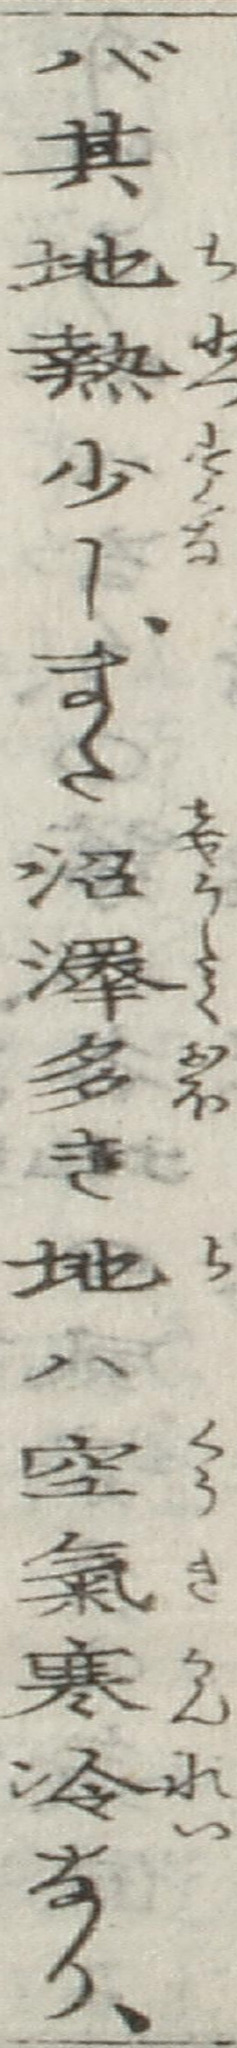ば其地熱少し、また沼沢多き地は空気寒冷なり、
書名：訓蒙　天然地理學　下
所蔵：東京大学地震研究所図書室 Earthquake Research Institute Library, The University of Tokyo, JAPAN
